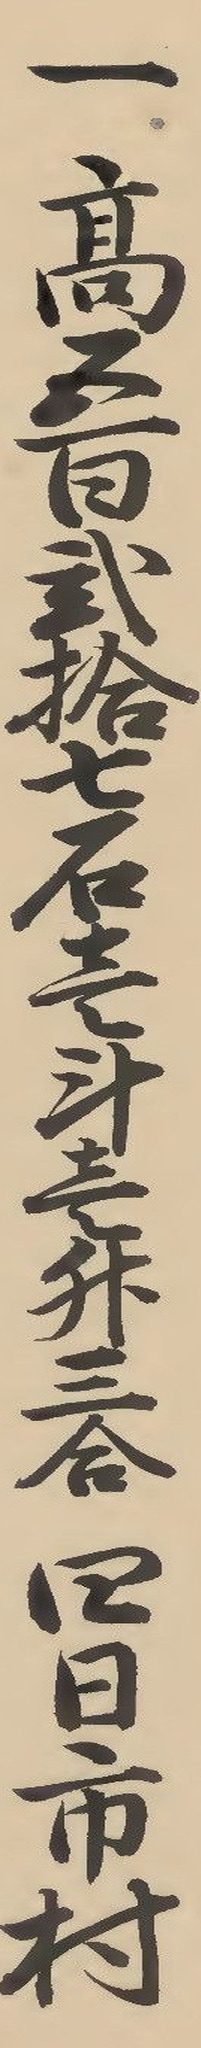一高五百弐拾七石壱斗壱升三合四日市村
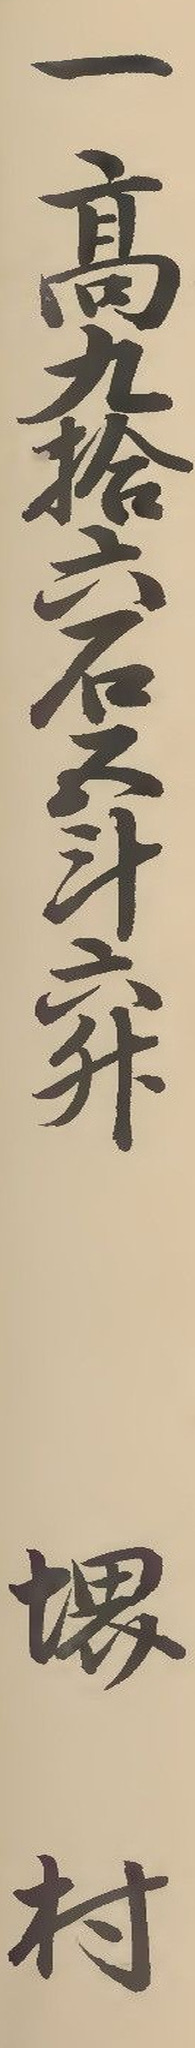一高九拾六石五斗六升堺村
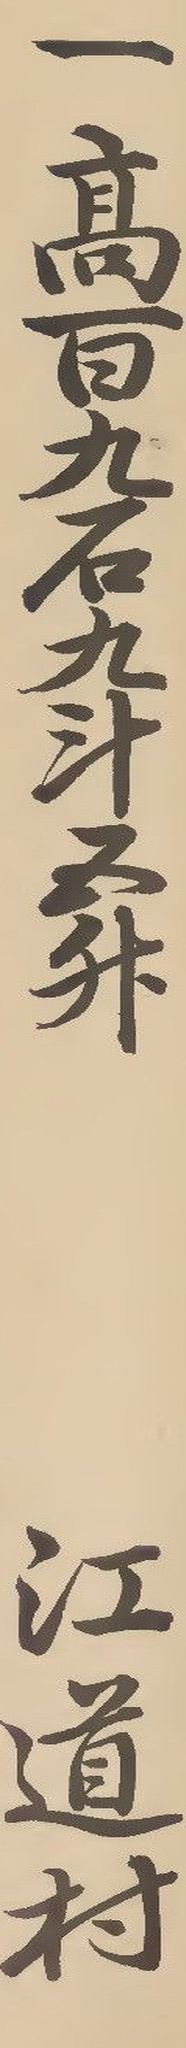一高百九石九斗五升江道村
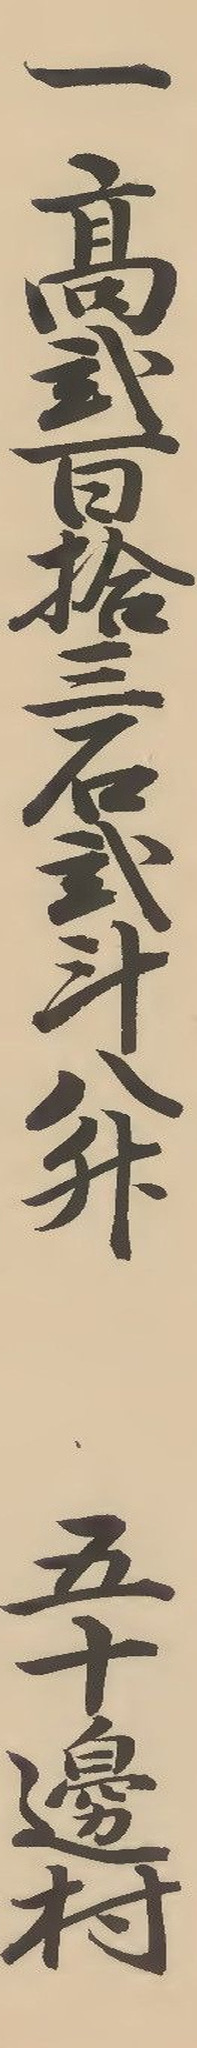一高弐百拾三石弐斗八升五十辺村
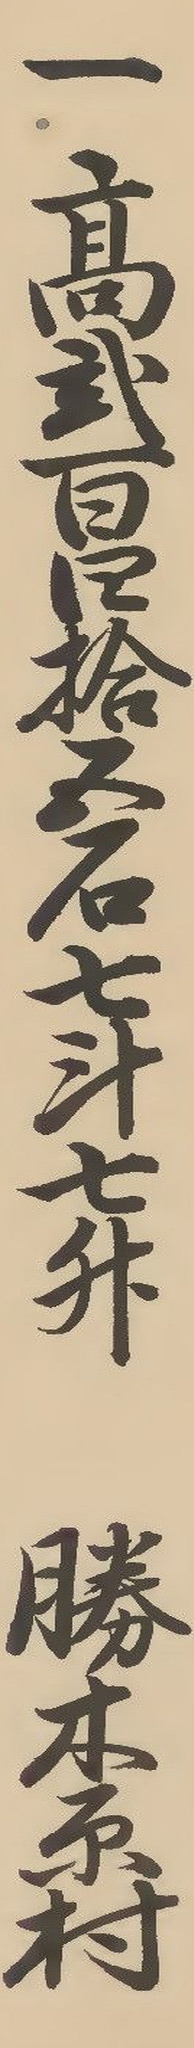一高弐百四拾五石七斗七升勝木原村

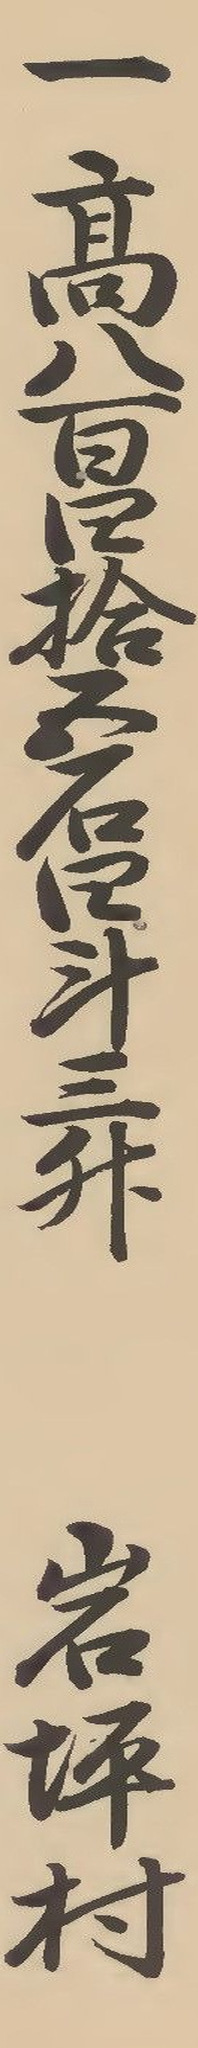一高八百四拾五石四斗三升岩坪村
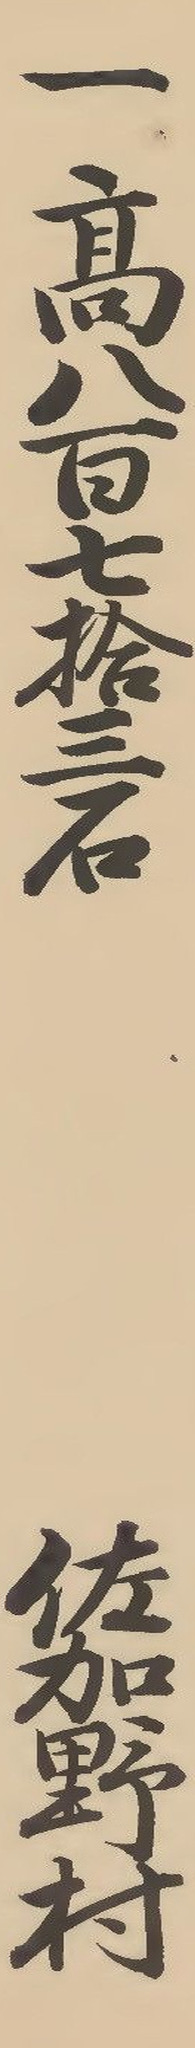一高八百七拾三石佐加野村
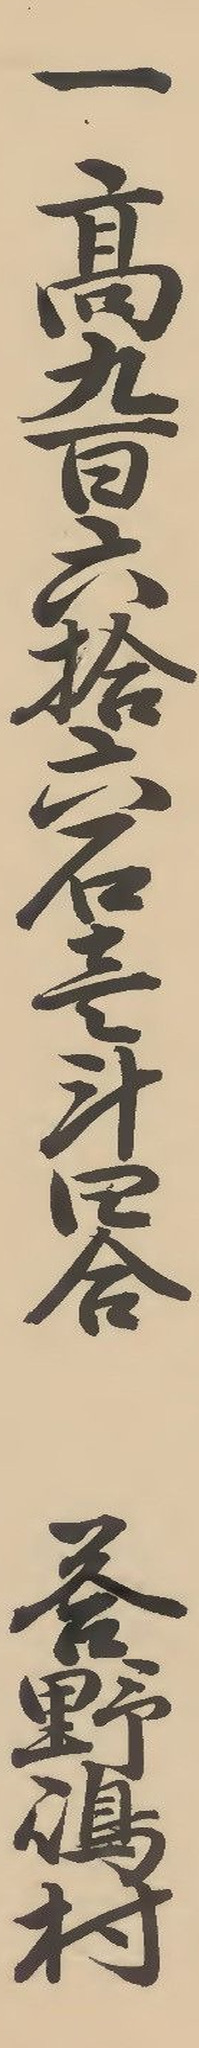一高九百六拾六石壱斗四合答野島村
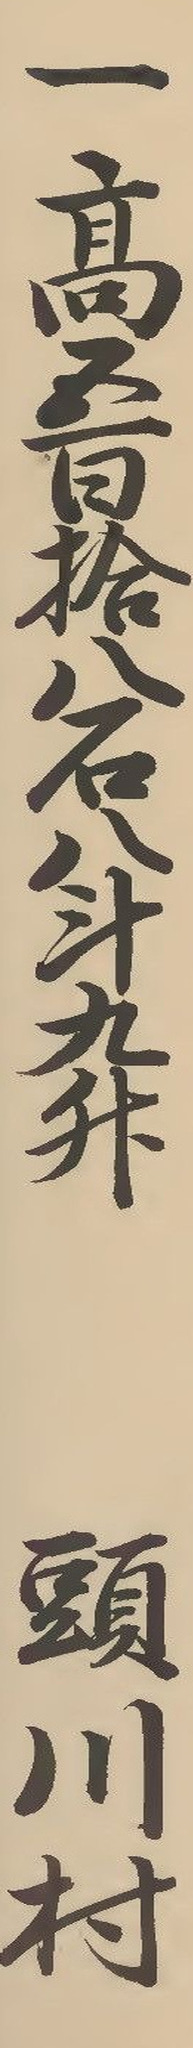一高五百拾八石八斗九升頭川村
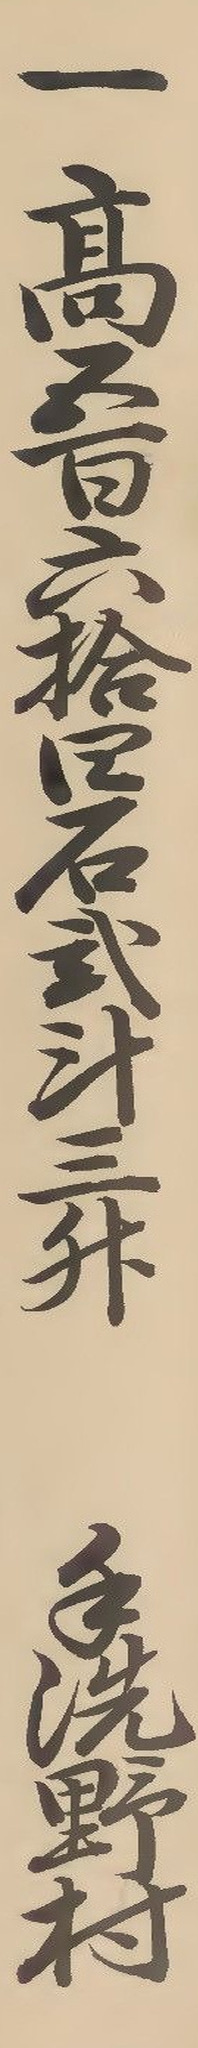一高五百六拾四石弐斗三升手洗野村
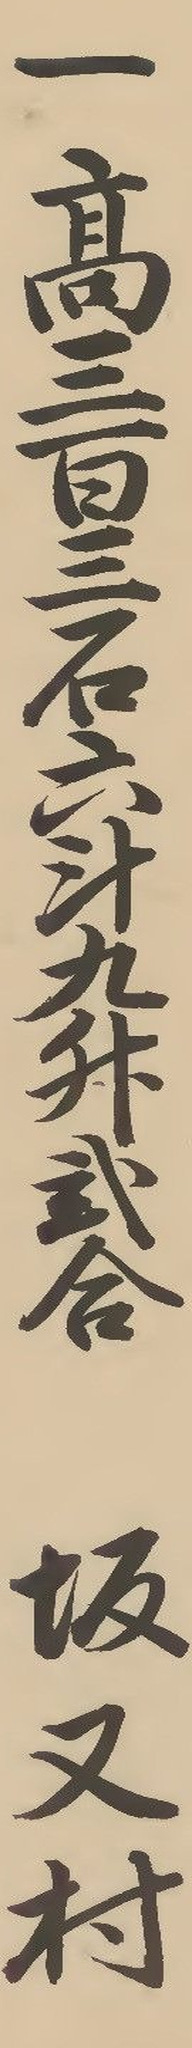一高三百三石六斗九升弐合坂又村
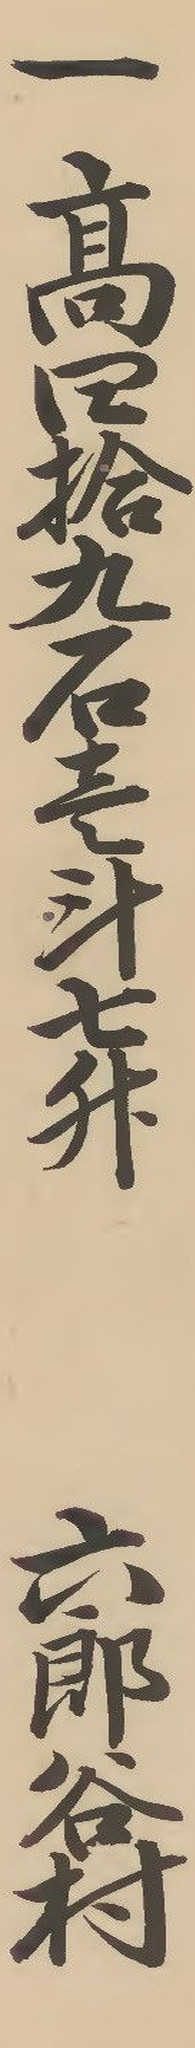一高四拾九石壱斗七升六郎谷村

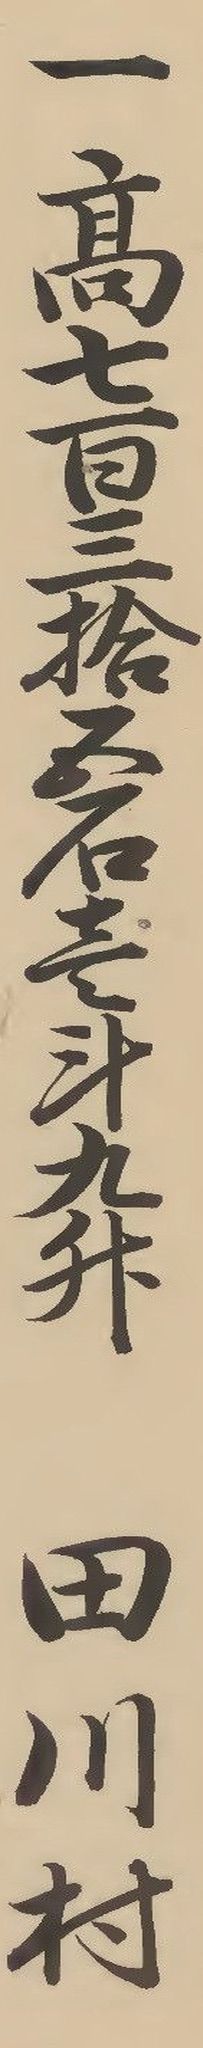一高七百三拾五石壱斗九升田川村
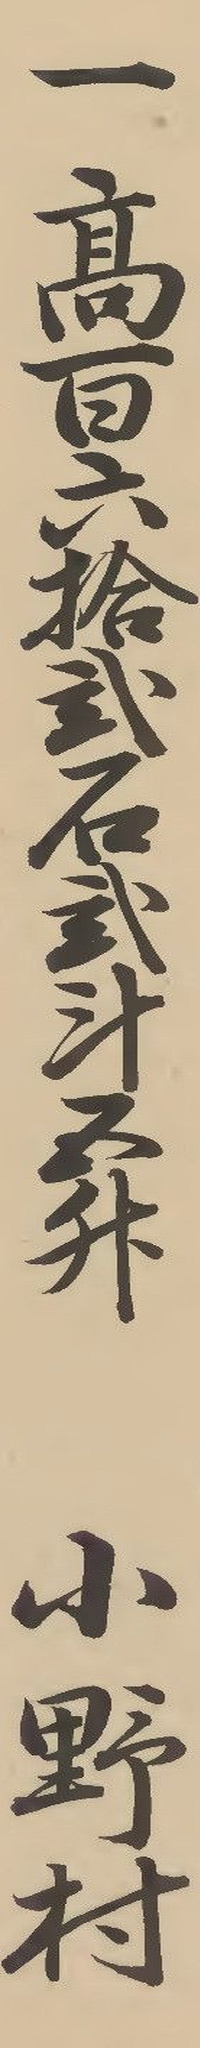一高百六拾弐石弐斗五升小野村
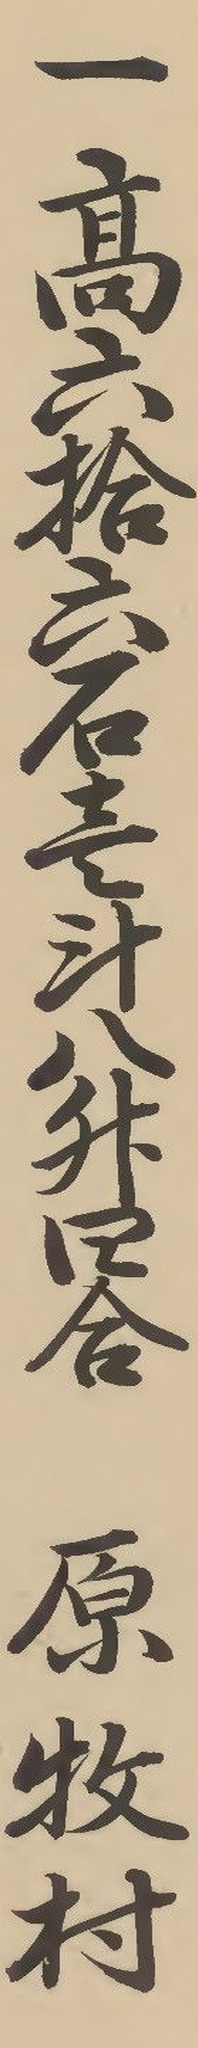一高六拾六石壱斗八升四合原牧村

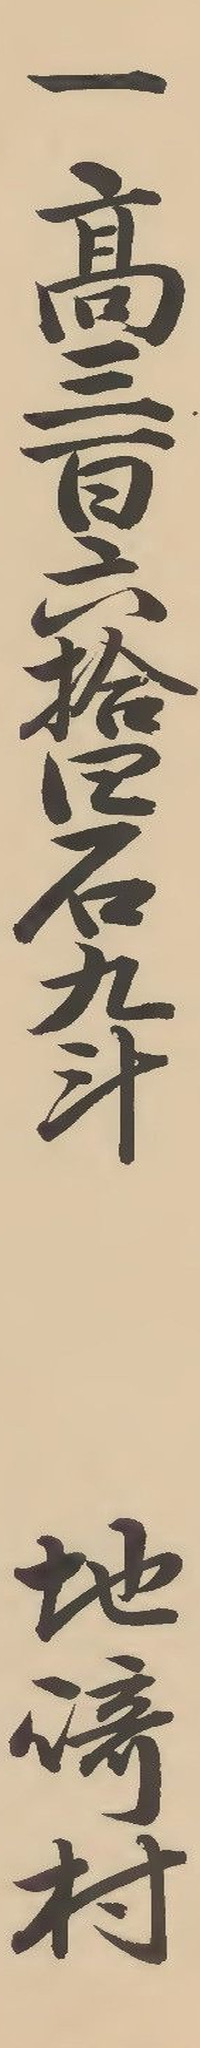一高三百六拾四石九斗地崎村
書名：越中国郷帳
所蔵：国立公文書館 National Archives of Japan
